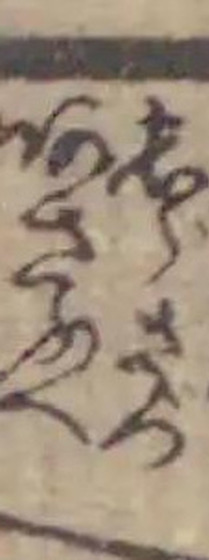あさふへ
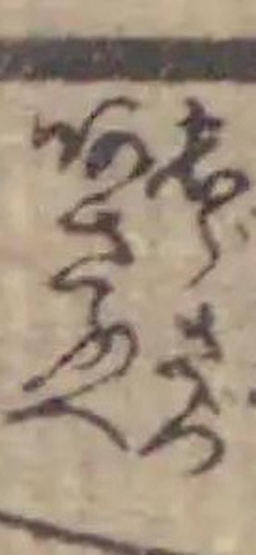あさふへ
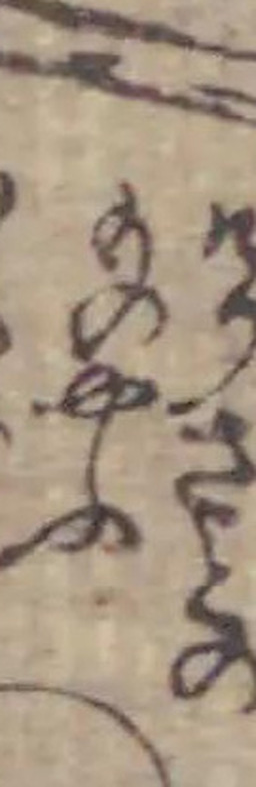ものやふ
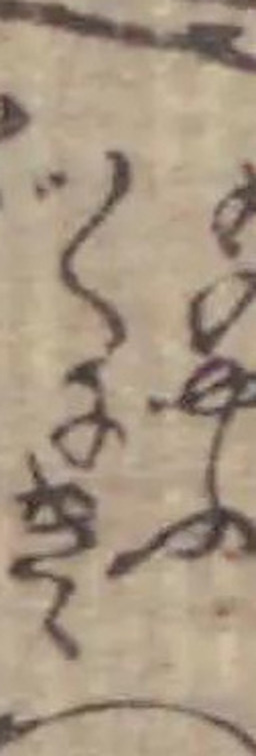〳〵にきゝ
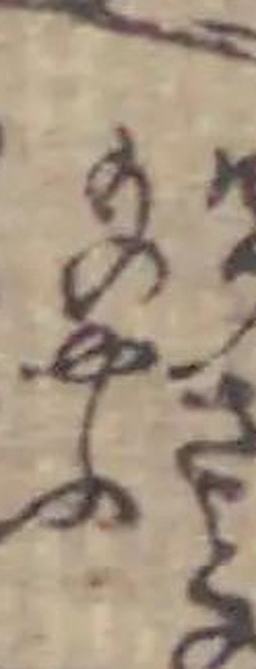ものやふ
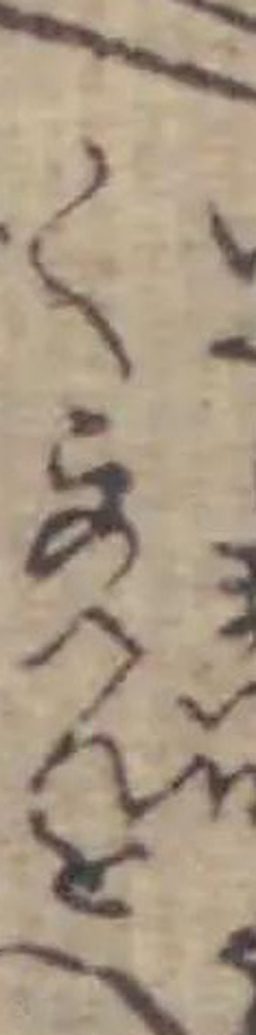〳〵このへんを
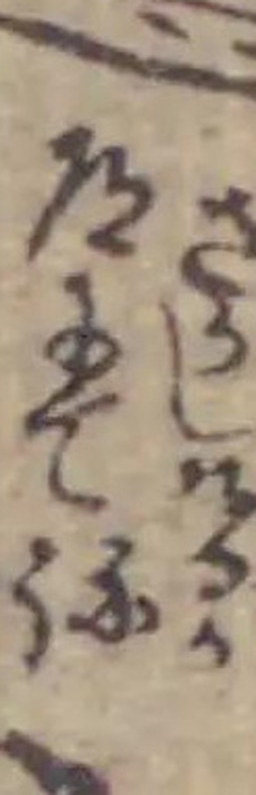道にて弥
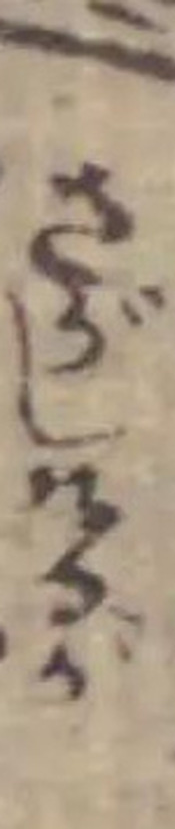さがしけるが
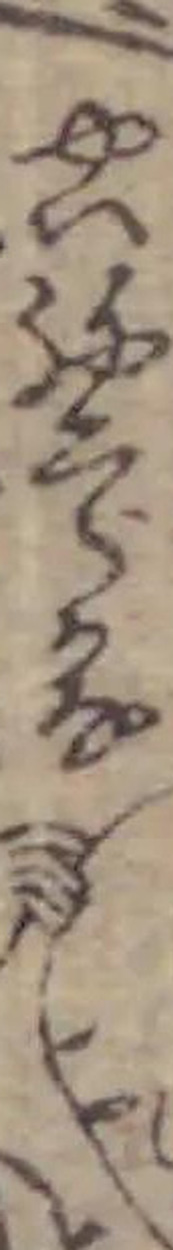やい弥二郎かな
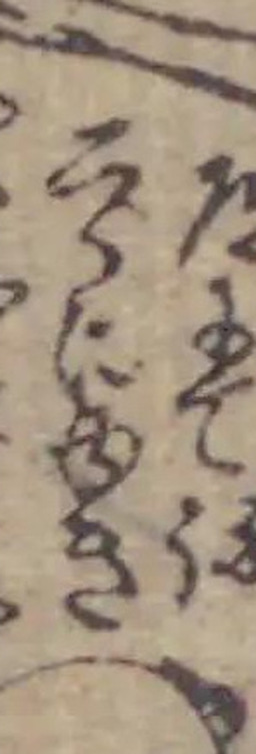二郎にゆき
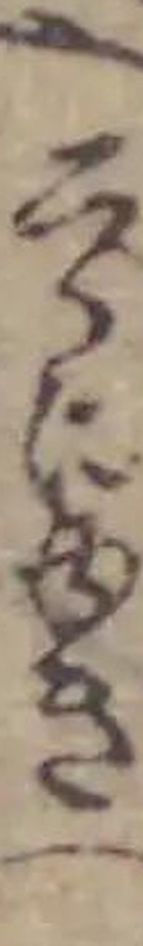二郎にゆき
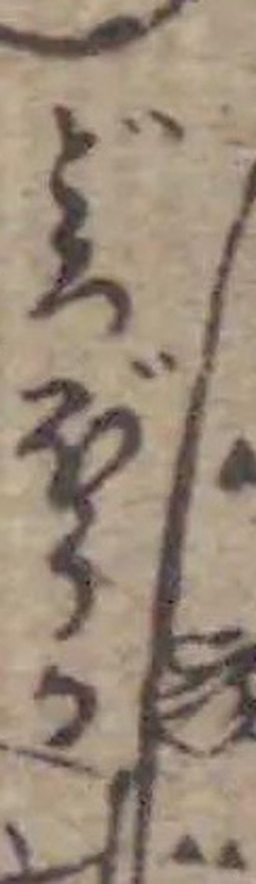どろぼうか
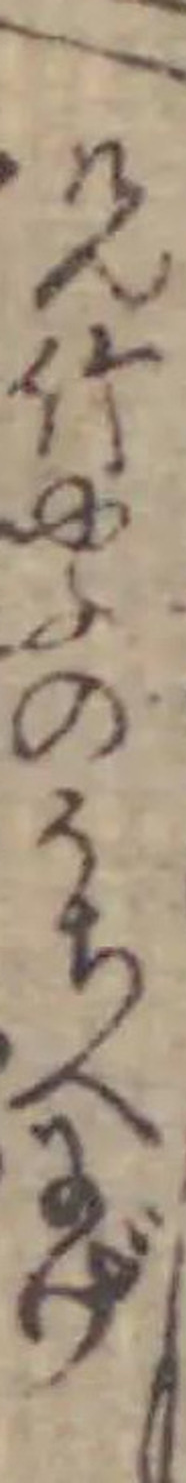けん竹やふのうちへにげ
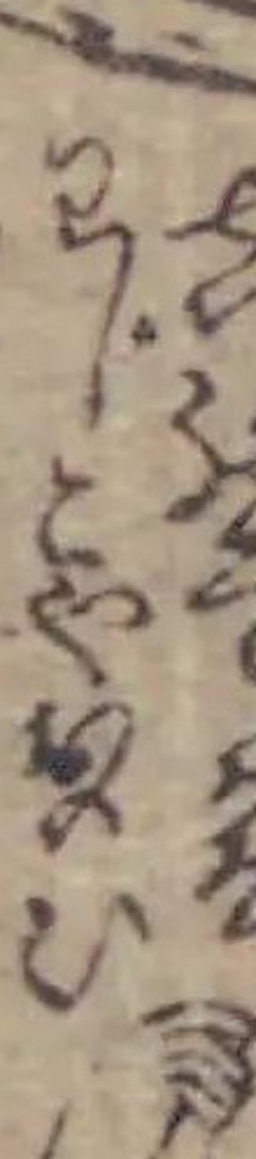わじとやおもひ
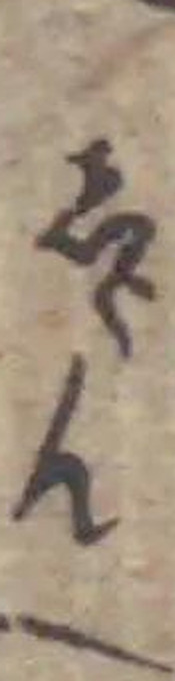しらん
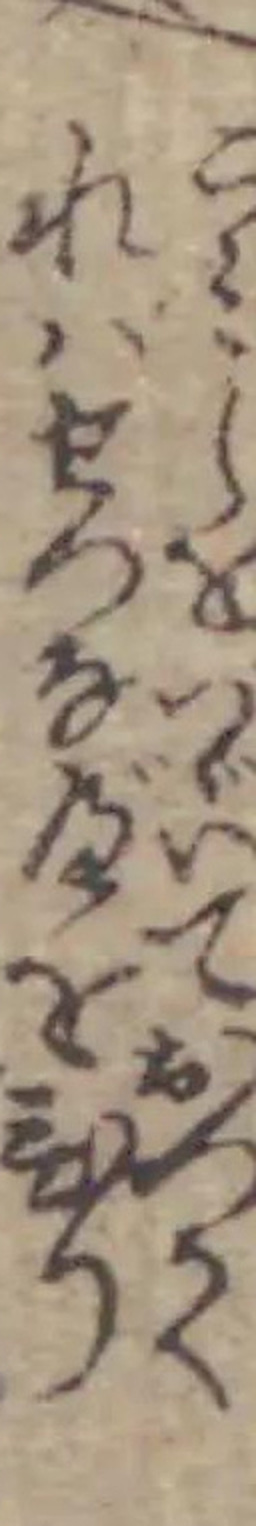ればせつなべをひり
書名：虚言弥二郎傾城誠 3巻
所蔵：国立国会図書館 National Diet Library, JAPAN
